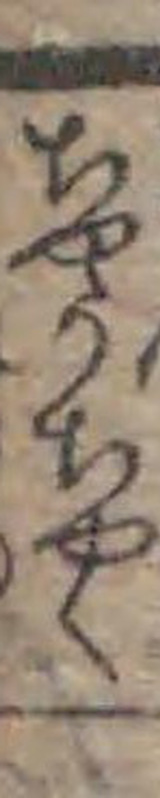ちやうちやく
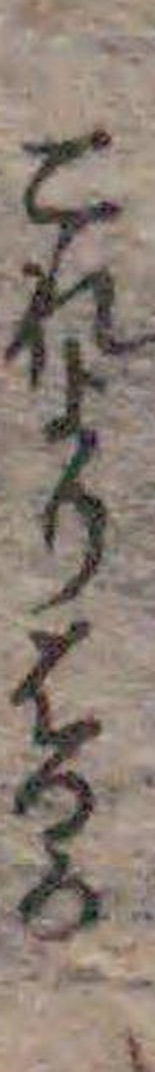これよりはるか
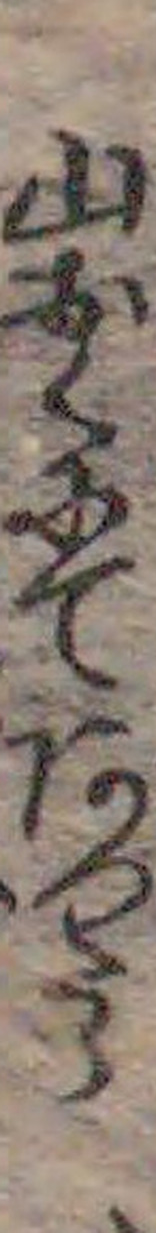山おくにてあつたら
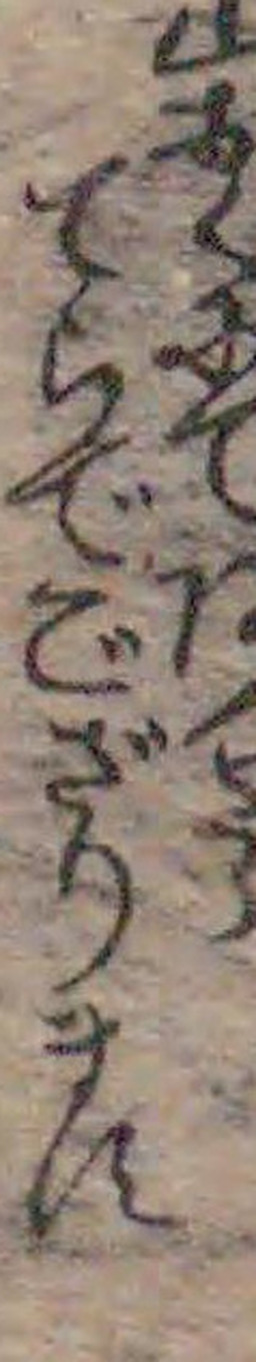てらでござります

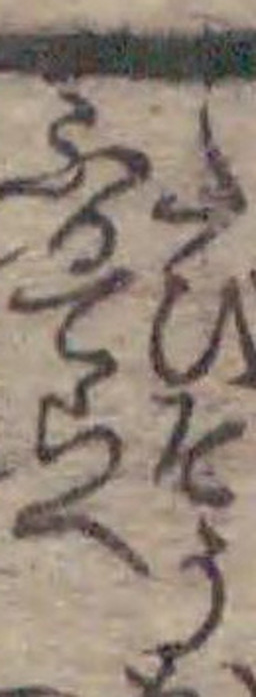ふるてらへ
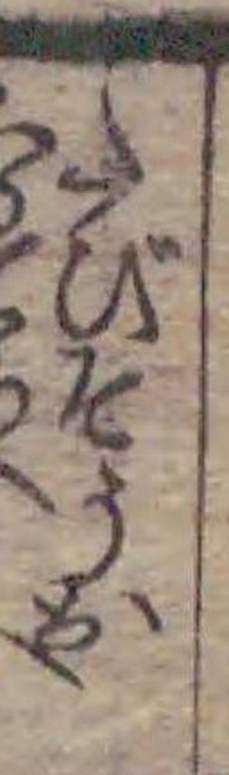たびそうお
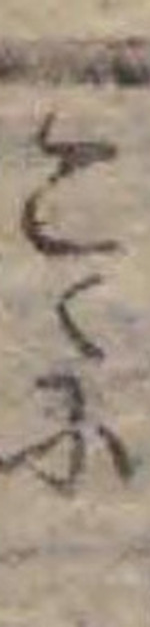こゝに
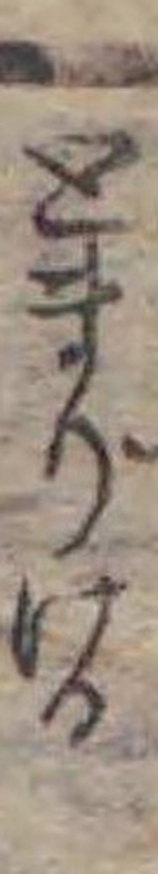とまりける
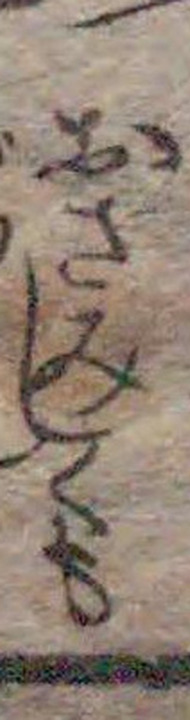おさみしくも
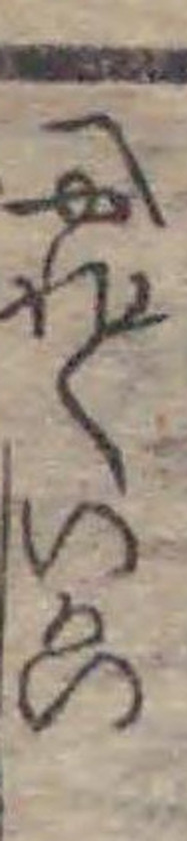〽やれ〳〵いかい
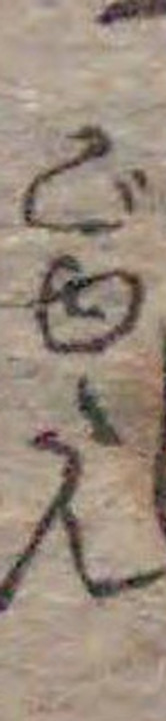ごゆたん
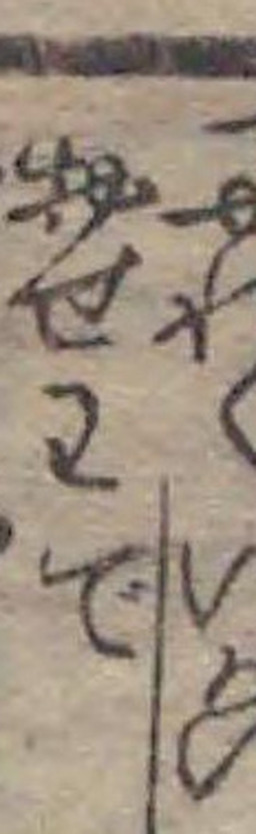おせわで
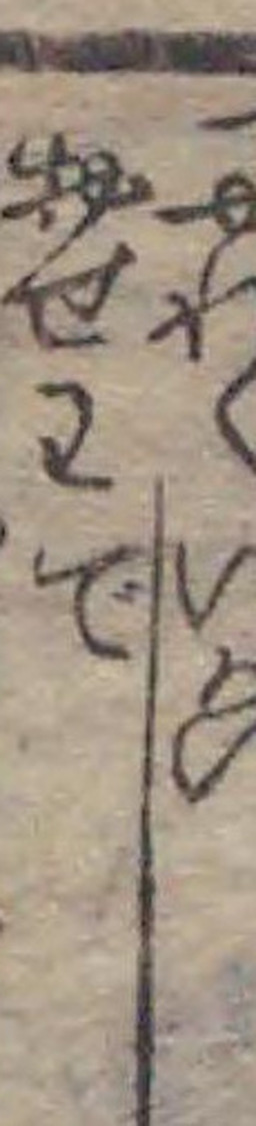おせわで
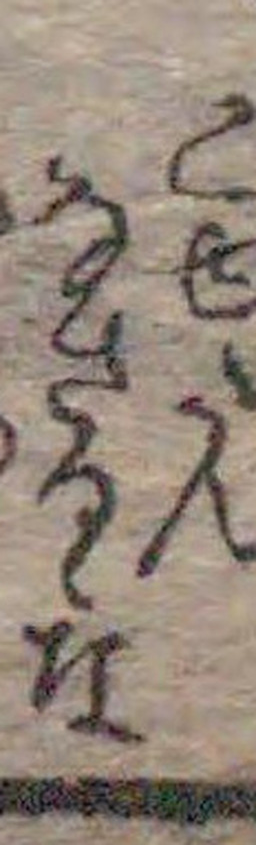なさるゝな
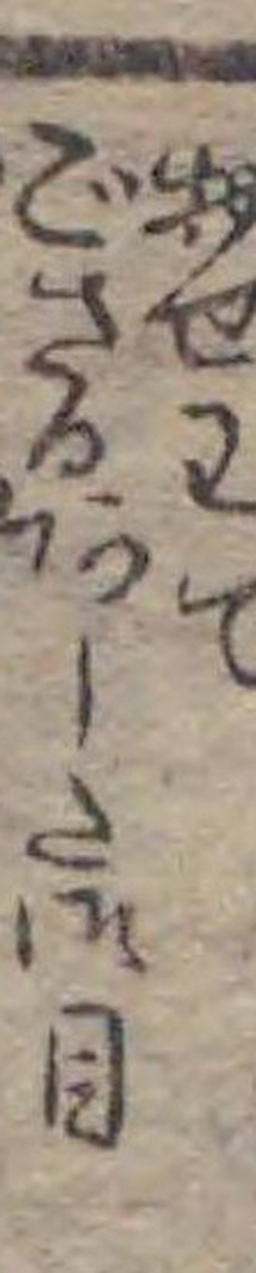ござるあした御目
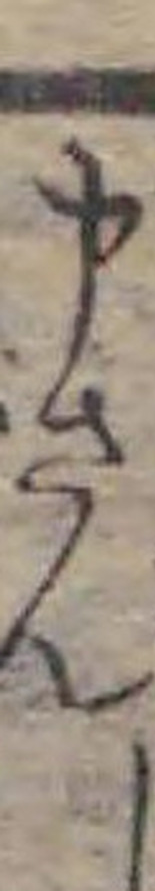申さん
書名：歌の化物一寺再興 : 2巻
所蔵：国立国会図書館 National Diet Library, JAPAN
